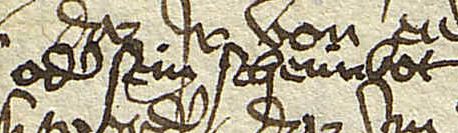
od* ſein ſcheimbot
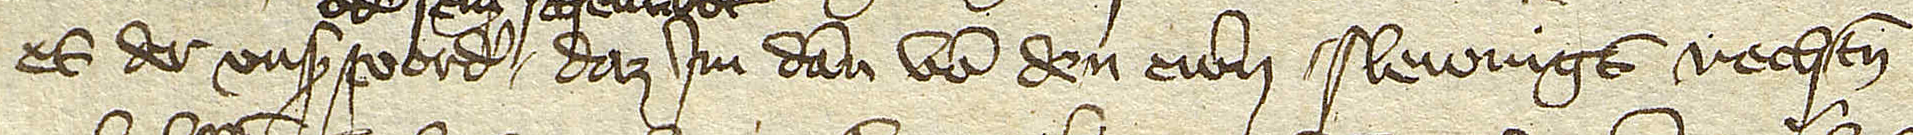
es der vnſ* vord* / daʒ Im dan* vo* den ew*n / ſlewnigs rechtn*
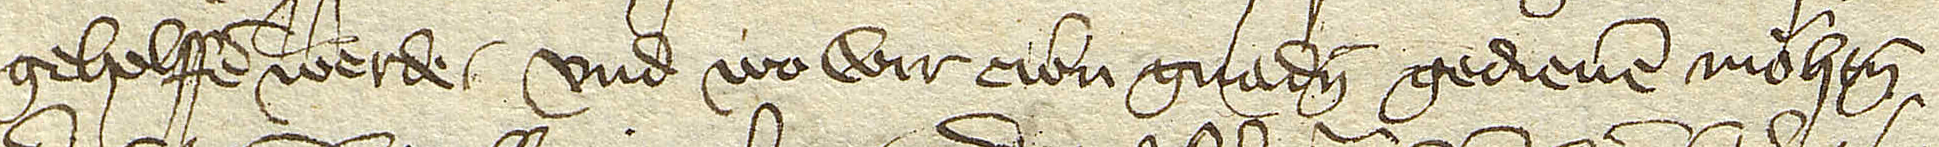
geholffe* werde / vnd wo wir ew*n gnadn* gediene* möhtn*
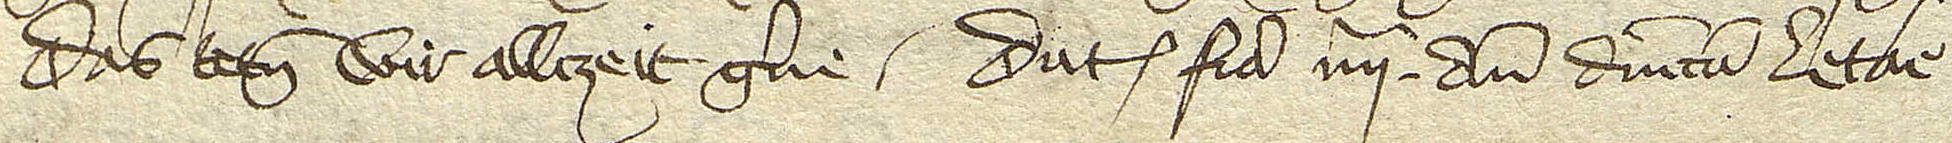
Das tetn* wir allcʒeit g*ne / Dat* fia* iiii* . An* dnica* Letae*
